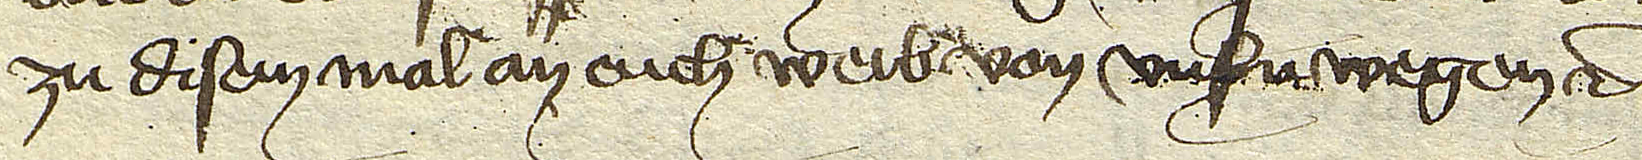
cʒu diſem mal an euch werb von vnſ*n wegen ec*
